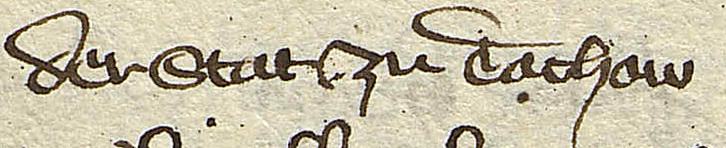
Der Stat cʒu Tachaw
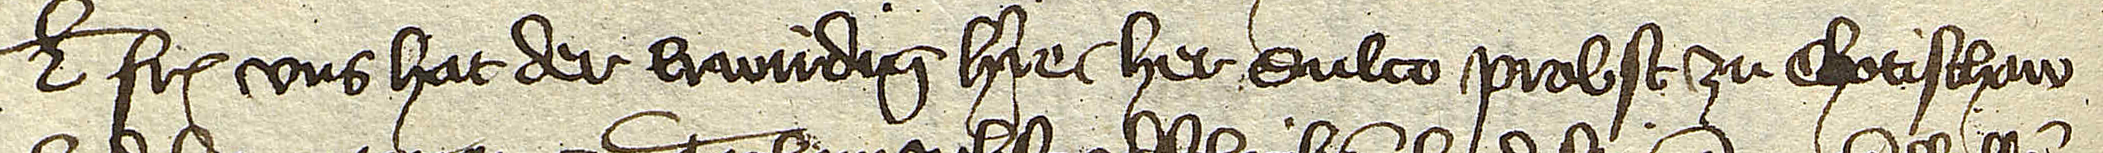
L* fr* vns hat der Erwirdig h*re / her Sulco probſt cʒu Chotiſchaw
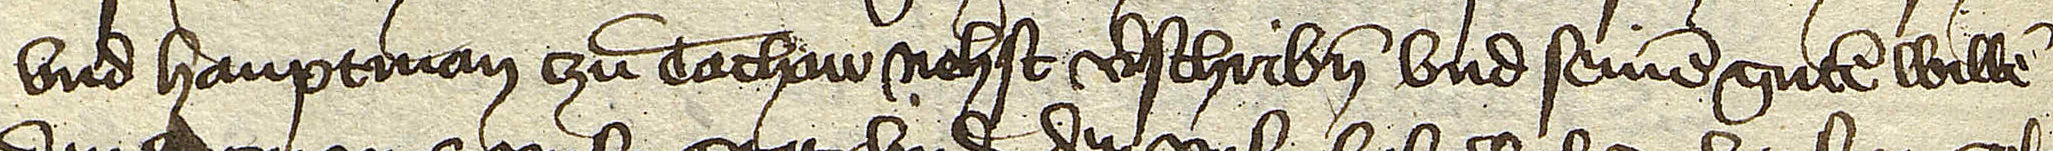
vnd hauptman cʒu Tachaw nehſt v*ſchribn* vnd ſeine* gute* wille*
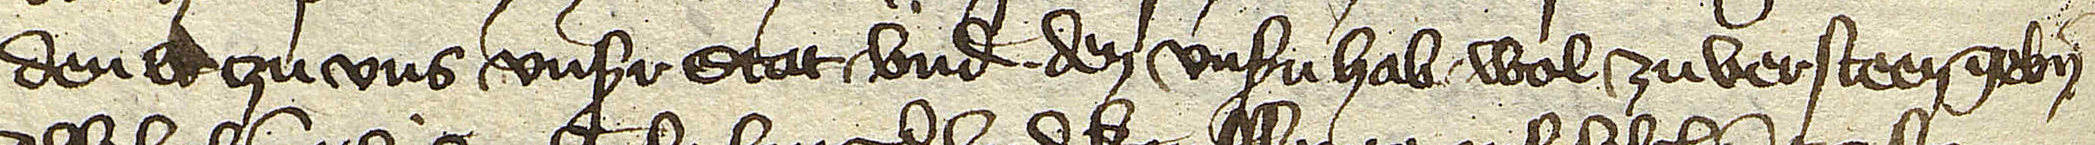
den Er cʒu vns vnſ*r Stat / vnd den vnſ*n hab / wol cʒu verſteen gebn*
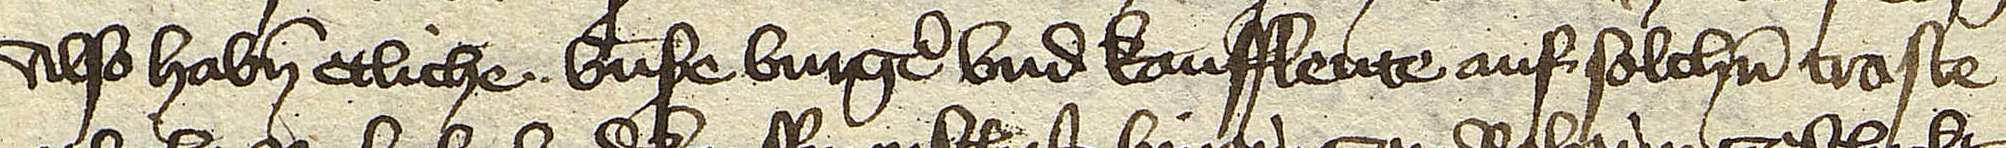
Alſo habn* etliche vnſ*e burge* vnd kauffleute auf ſolchn* troſte
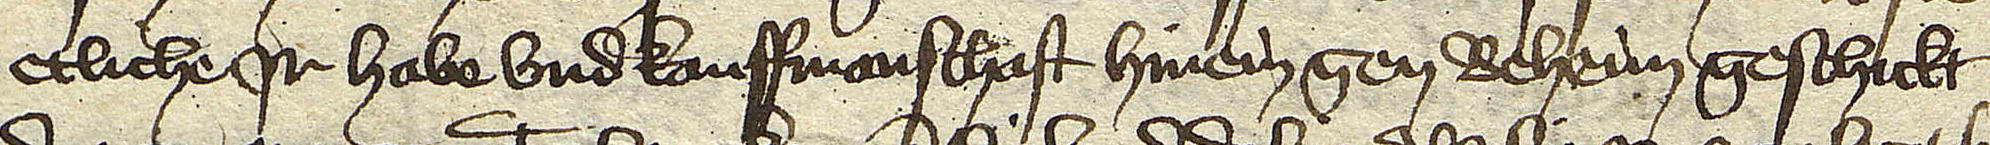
etliche Ir habe vnd kauffmanſchaft hinein gen Beheim geſchickt
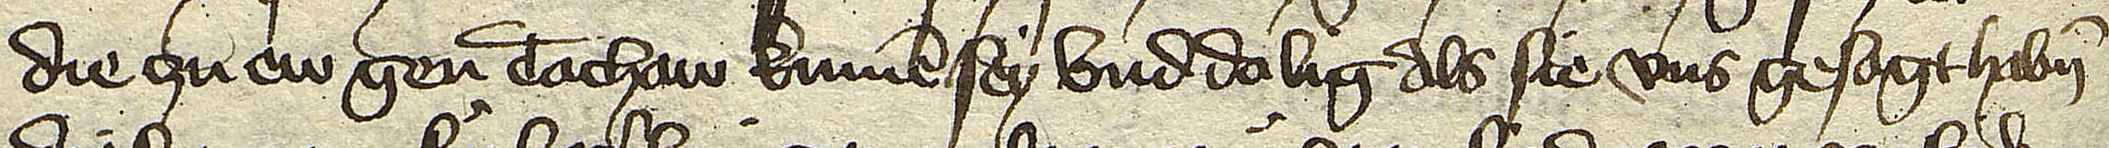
die cʒu ew gen Tachaw kume* ſey vnd do lig Als ſie vns geſagt habn*
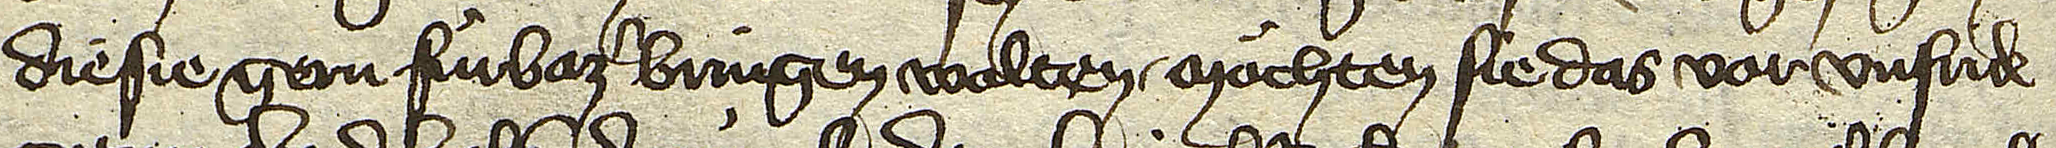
die ſie gern fürbaʒ* bringen wolten / möchten ſie das vor vnfride
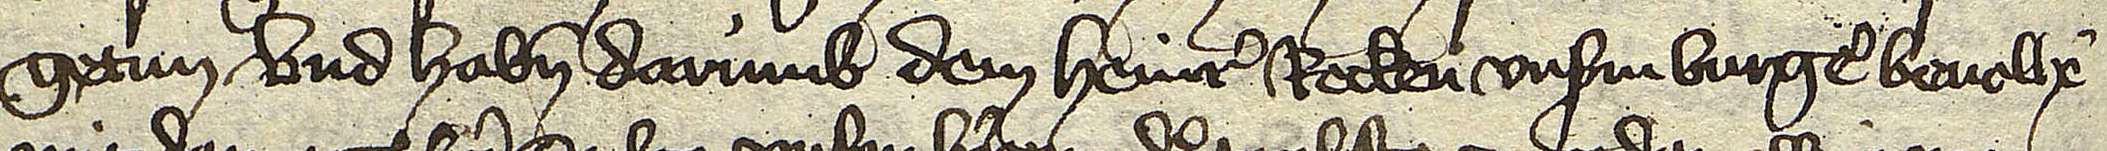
getun / vnd habn* darümb dem Heinr* Recken vnſ*m burge* beuolhe*
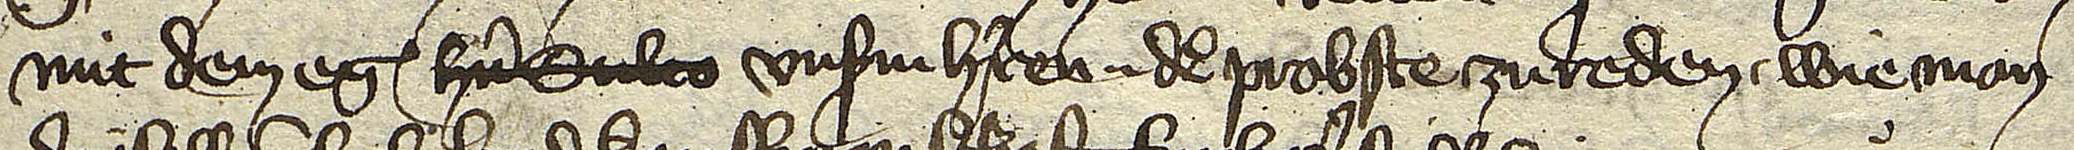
mit dem eg* hn* Sulco vnſ*m h*ren ~ de probſte cʒu reden / wie man
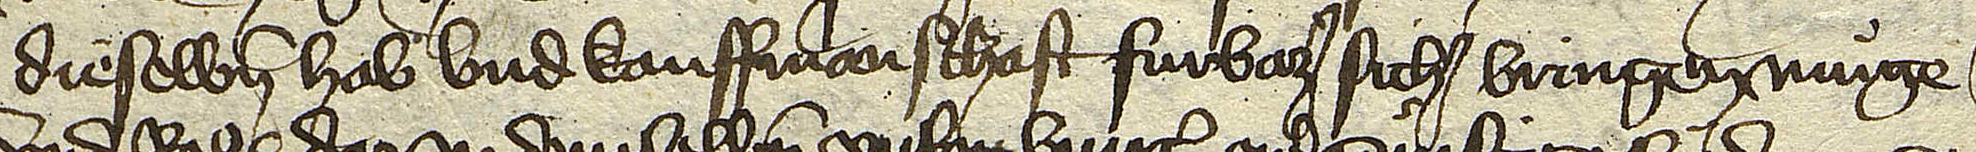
dieſelbn* hab vnd kauffmanſchaft furbaʒ* ſich* bringen müge
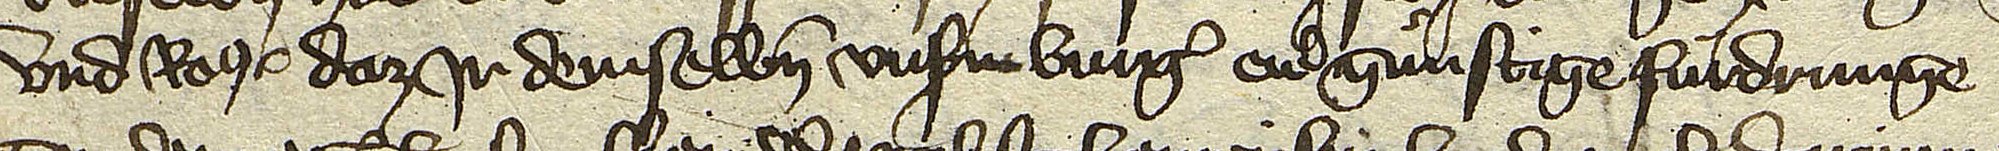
vnd Ro* / daʒ Ir demſelbn* vnſ*m burg* ew* günſtige fürdrunge
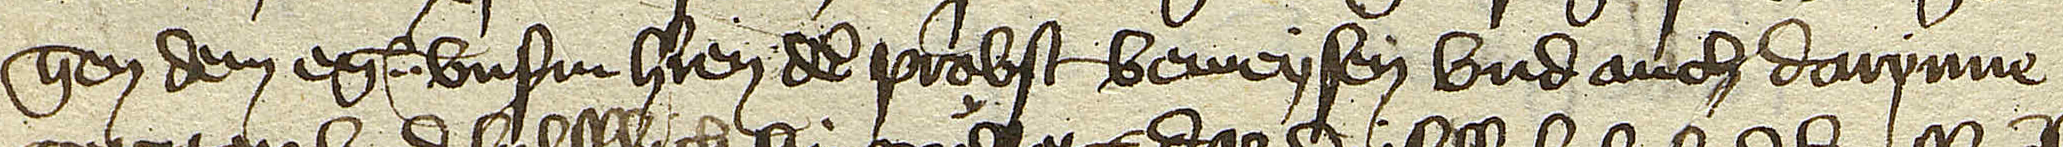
gen dem eg* ~ vnſ*m h*ren de* probſt beweyſen vnd auch darynne
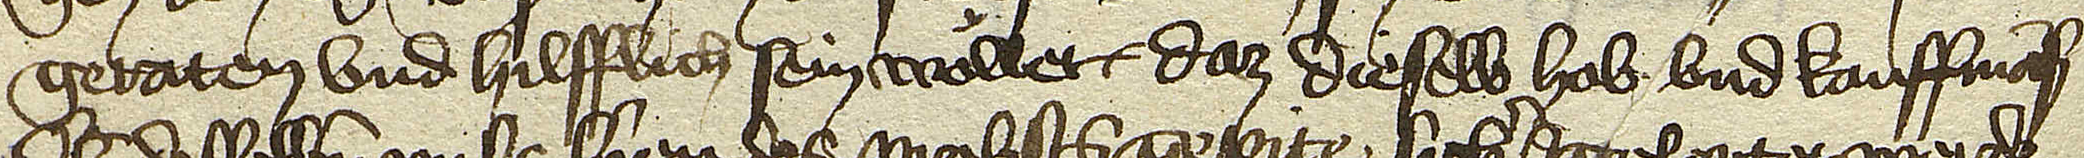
geraten vnd hilfflich ſein wöllet / daʒ dieſelb hab vnd kauffma*ſ*
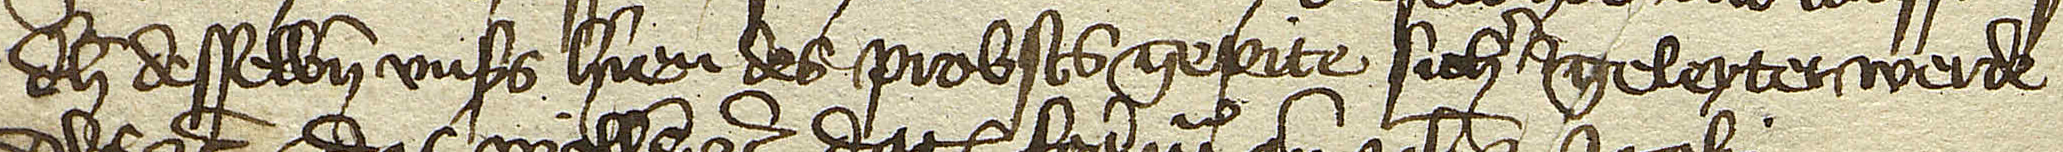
d*h deſſelbn* vnſ*s h*ren des probſts gepeite ſich* geleytet werde
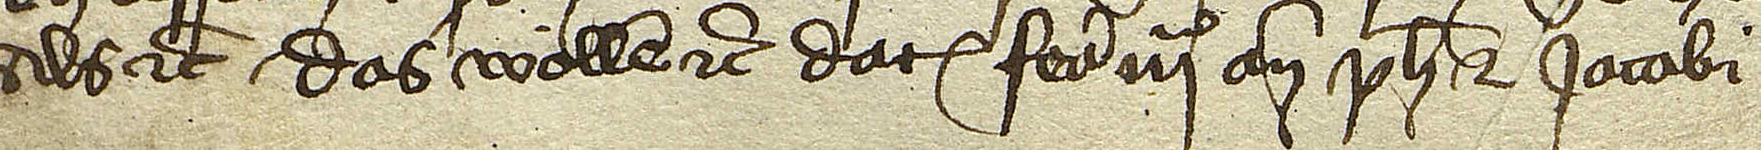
Als ec* / das wölle* ec* dat* fea* iii* an* ph* @ Iacobi
